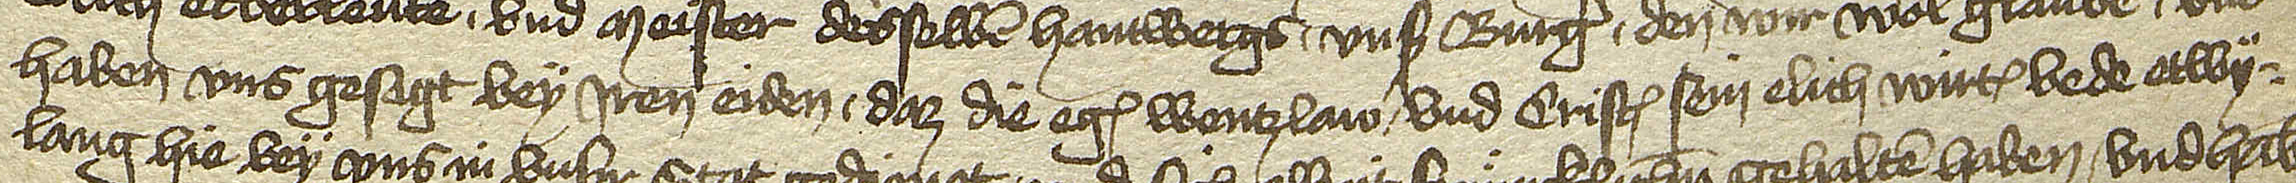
haben vns geſagt bey Iren eiden / daʒ die eg* wentʒlaw / vnd Criſt* ſein elich wirt* bede etwy =
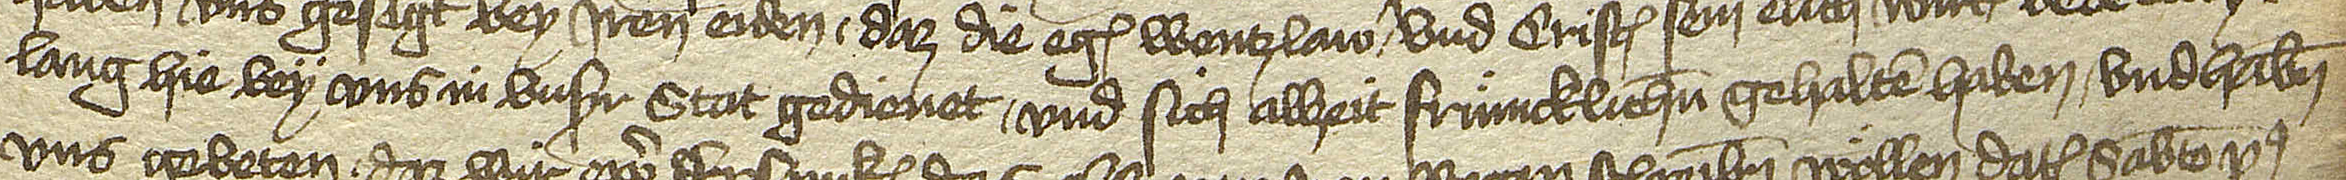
lang hie bey vns in vnſ*r Stat gedienet / vnd ſich allcʒeit frümcklichn* gehalte* haben / vnd habn*
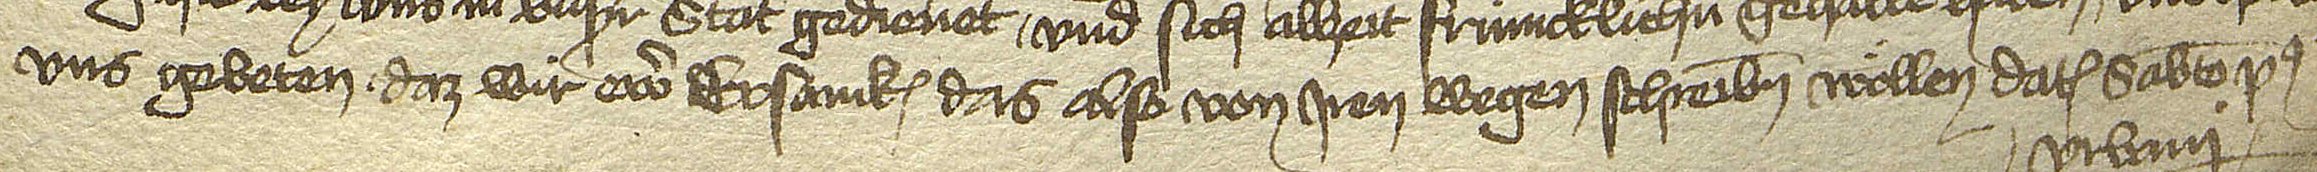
vns gebeten / daʒ wir ew* Erſamk* das alſo von Iren wegen ſchreibn* wöllen dat* Sabto* p*
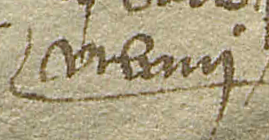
vrbani
